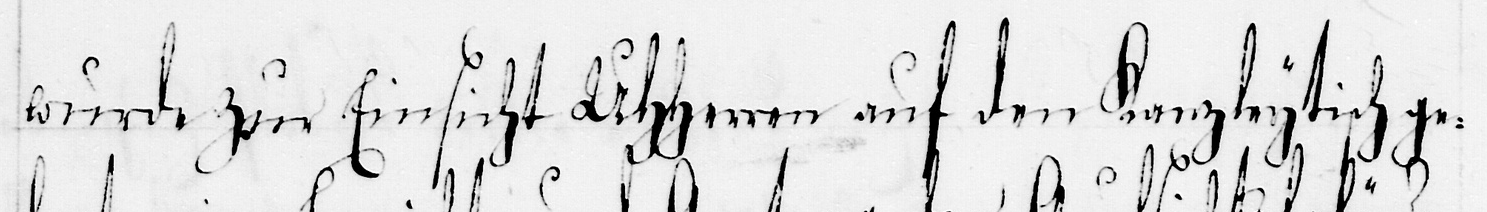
wurde zur Einsicht UHHerren auf den Kanzleytisch
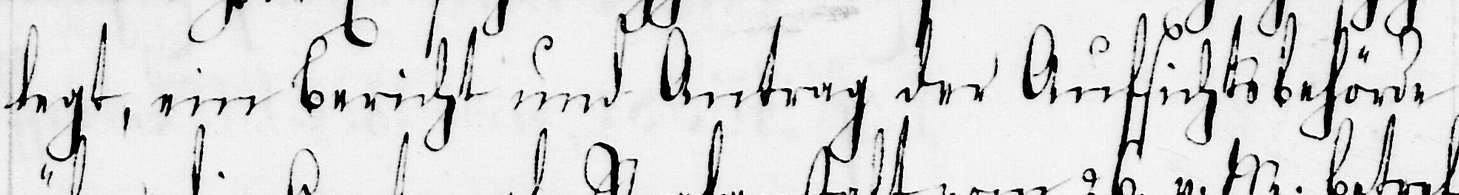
legt, ein Bericht und Antrag der Aufsichtsbehörde
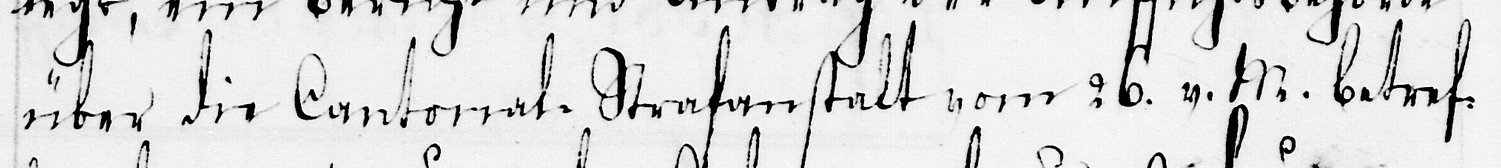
über die Cantonal-Strafanstalt vom 26. v. M. betref¬
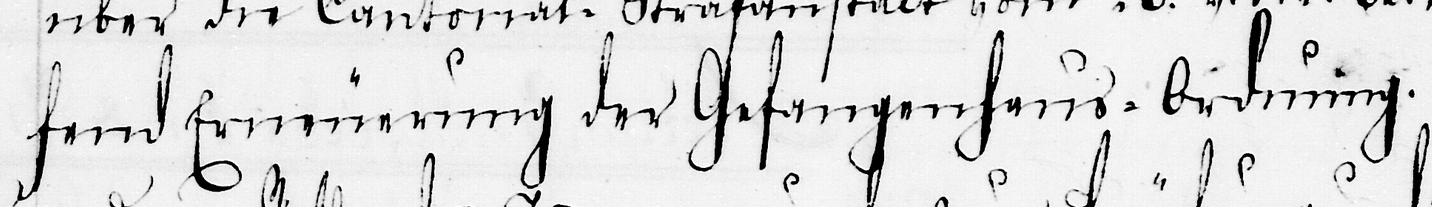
fend Erneuerung der Gefangenhaus-Ordnung.
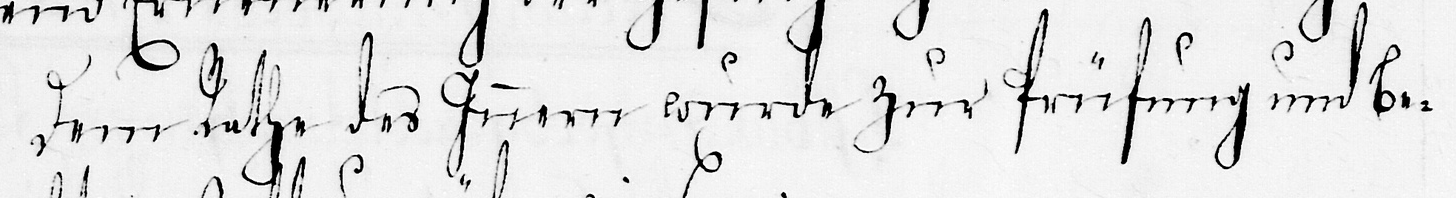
Dem Rathe des Innern wurde zur Prüfung und Be¬
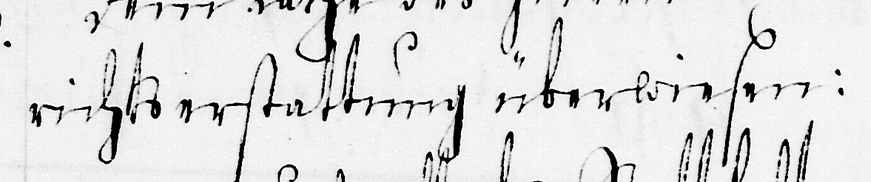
richtserstattung überwiesen:
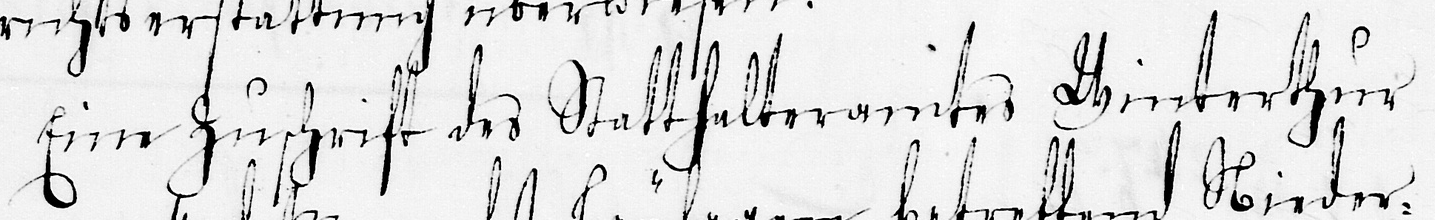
Eine Zuschrift des Statthalteramtes Winterthur
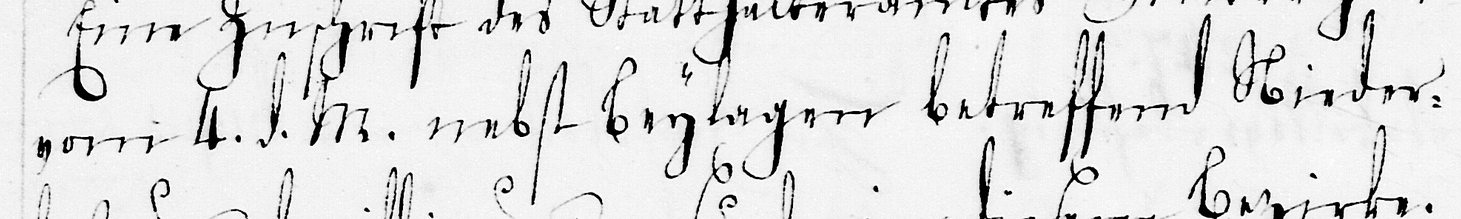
vom 4. d. M. nebst Beylagen betreffend Nieder¬
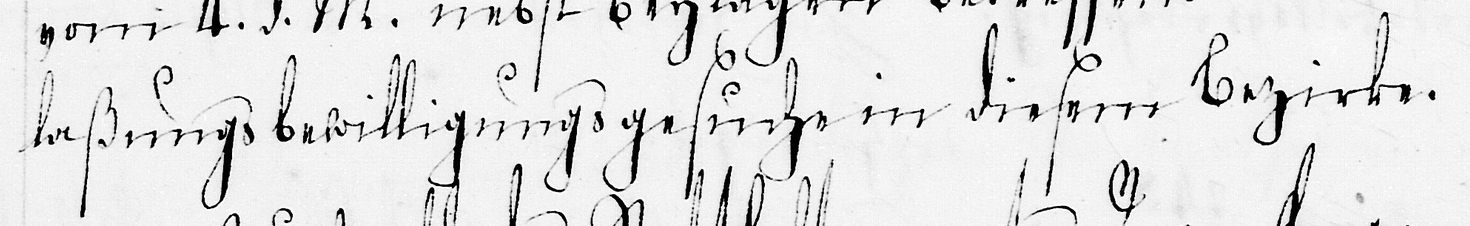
laßungsbewilligungsgesuche in diesem Bezirke.
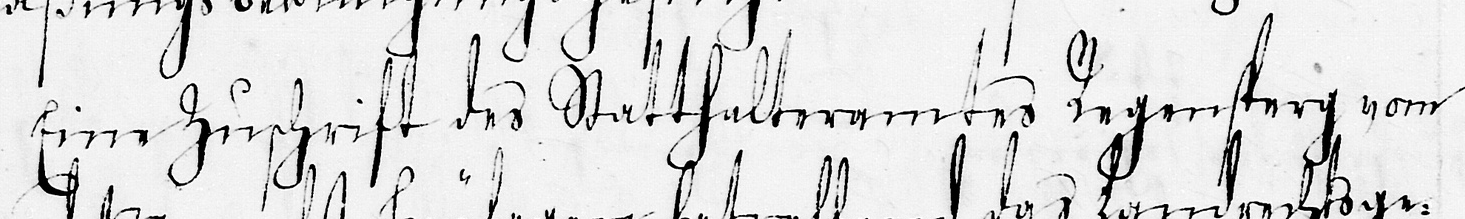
Eine Zuschrift des Statthalteramtes Regensperg vom
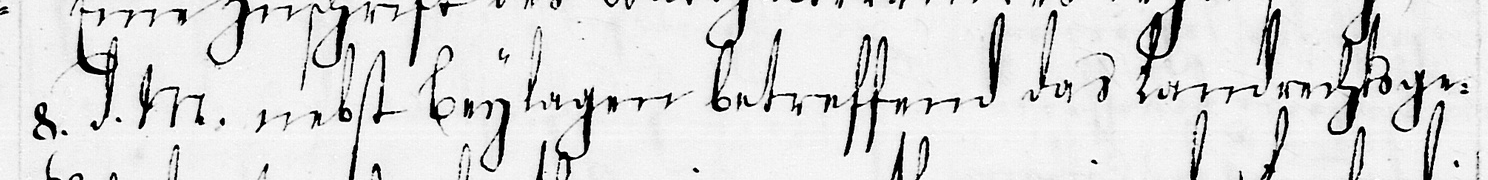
8. d. M. nebst Beylagen betreffend das Landrechtsge¬
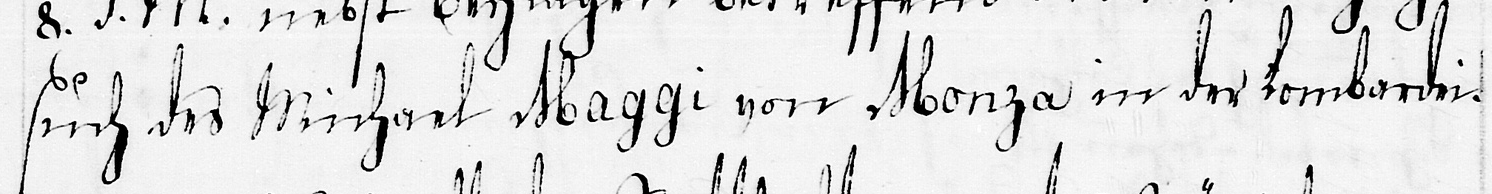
such des Michael Maggi von Monza in der Lombardei.
